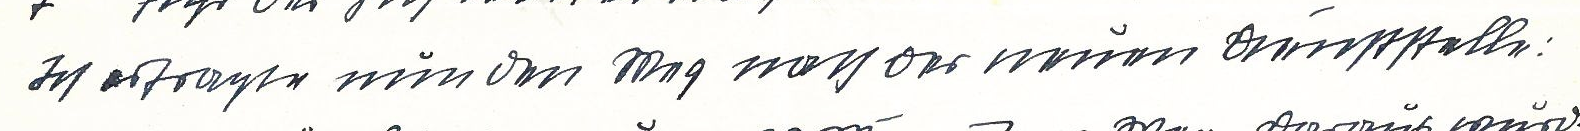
Ich erfragte nun den Weg nach der neuen Dienststelle:
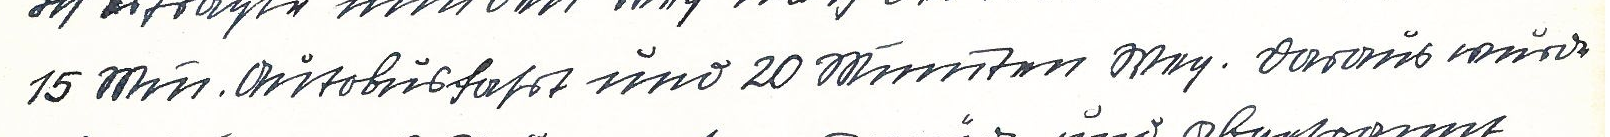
15 Min. Autobusfahrt und 20 Minuten Weg. Daraus wurde
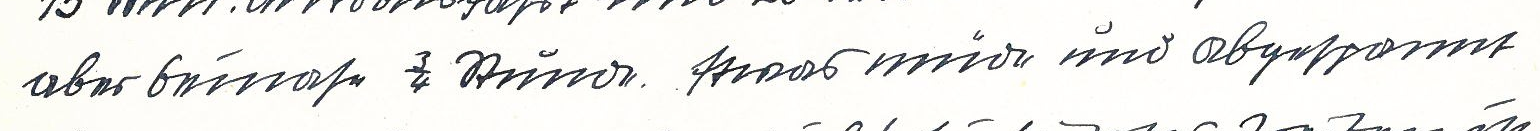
aber beinahe ¾ Stunde. Etwas müde und abgespannt
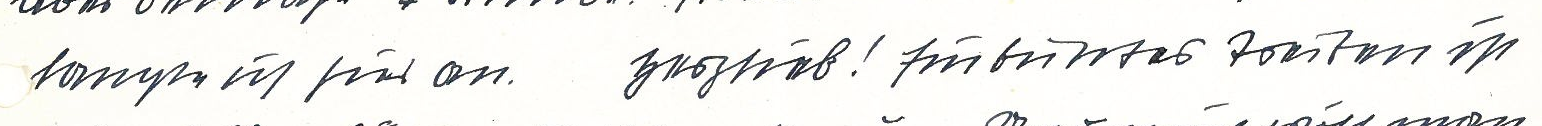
langte ich hier an. Herzlieb! Ein buntes Treiben ist
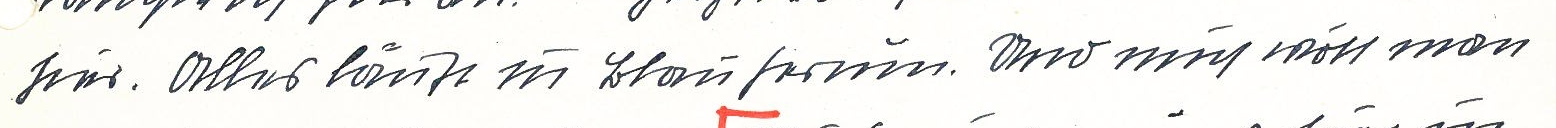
hier. Alles läuft in Blau herum. Und mich will man
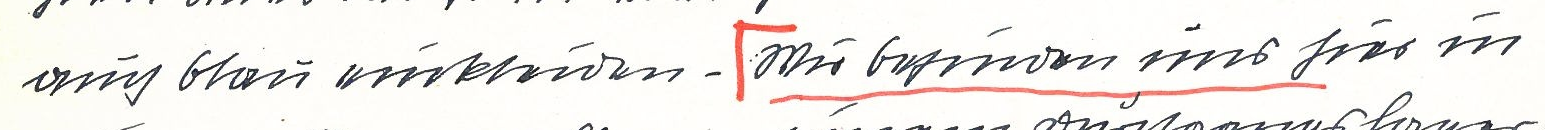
auch blau einkleiden – Wir befinden uns hier in
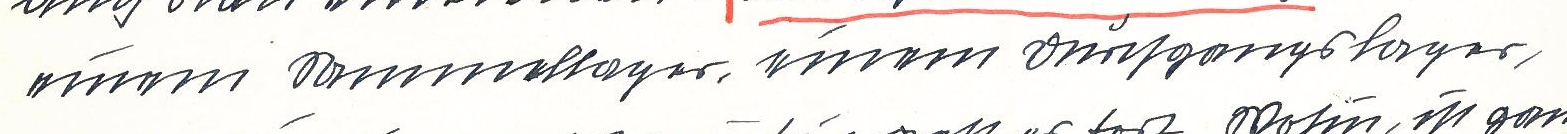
einem Sammellager, einem Durchgangslager,
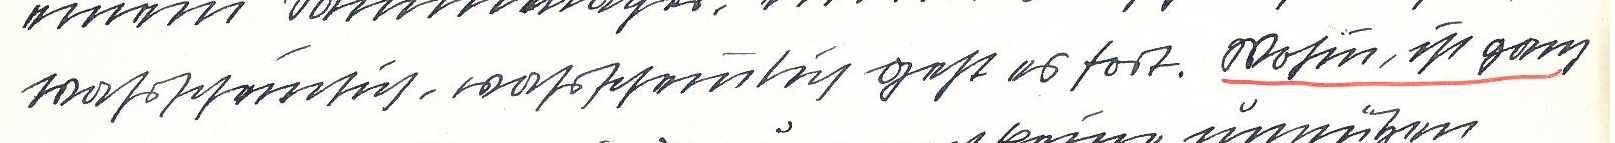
wahrscheinlich, wahrscheinlich geht es fort. Wohin, ist ganz
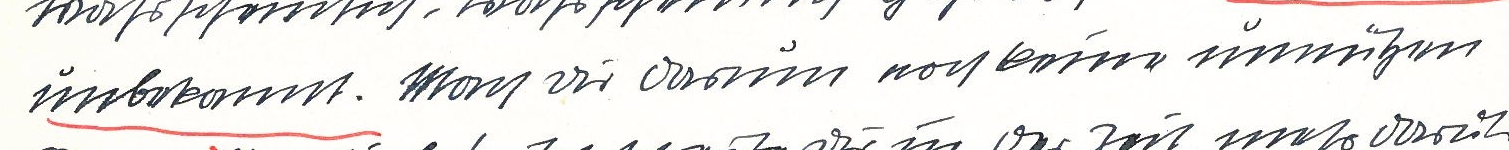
unbekannt. Mach dir darum noch keine unnützen
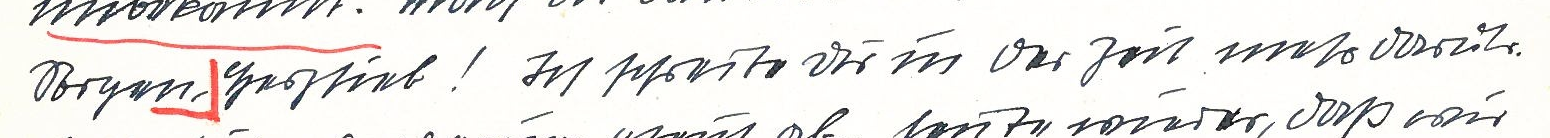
Sorgen, Herzlieb! Ich schreibe dir in der Zeit mehr darüber.
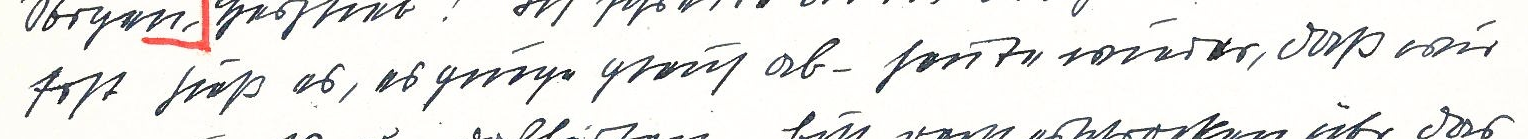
Erst hieß es, es ginge gleich ab – heute wieder, dass mir
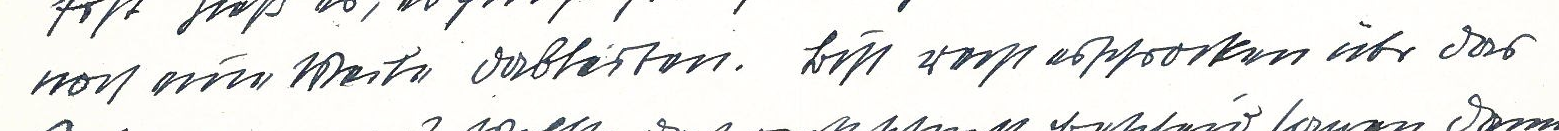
noch eine Weile dableiben. Bist recht erschrocken übr das
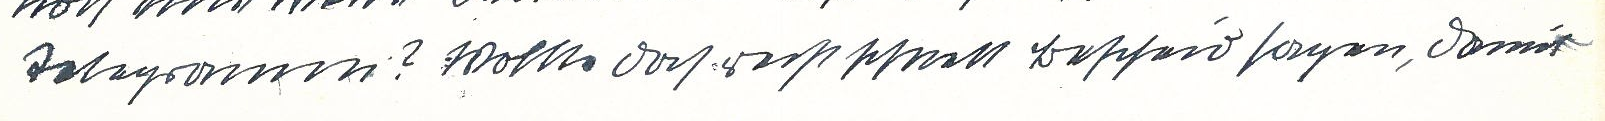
Telegramm? Wollte doch recht schnell Bescheid sagen, damit
